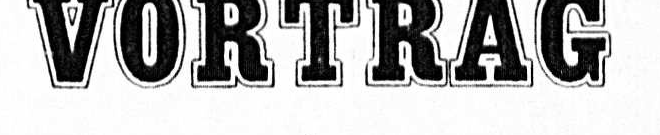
VORTRAG
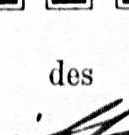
des
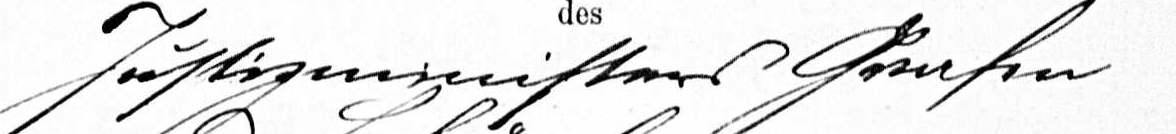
Justizministers
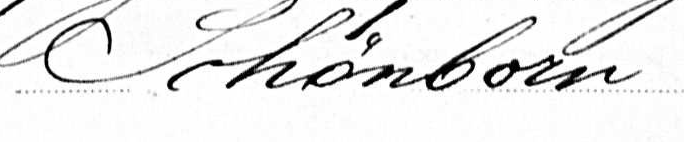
Grafen Schönborn
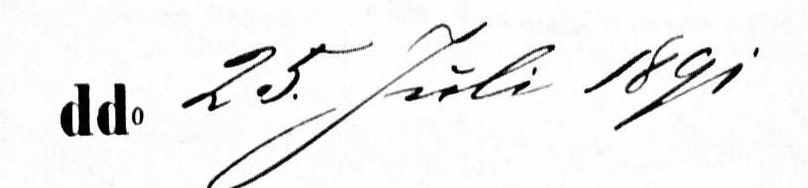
ddo 25. Juli 1891
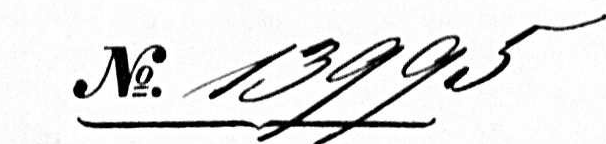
No. 13995
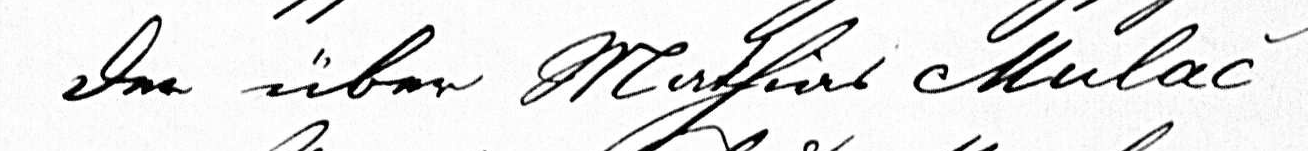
über Mathias Mulač
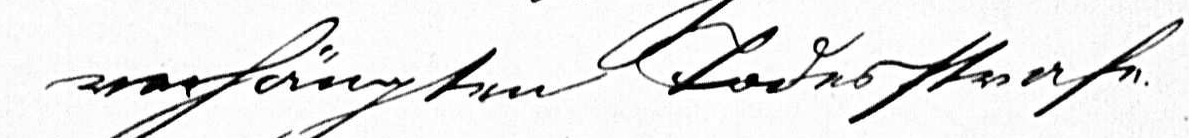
verhängte Todesstrafe.
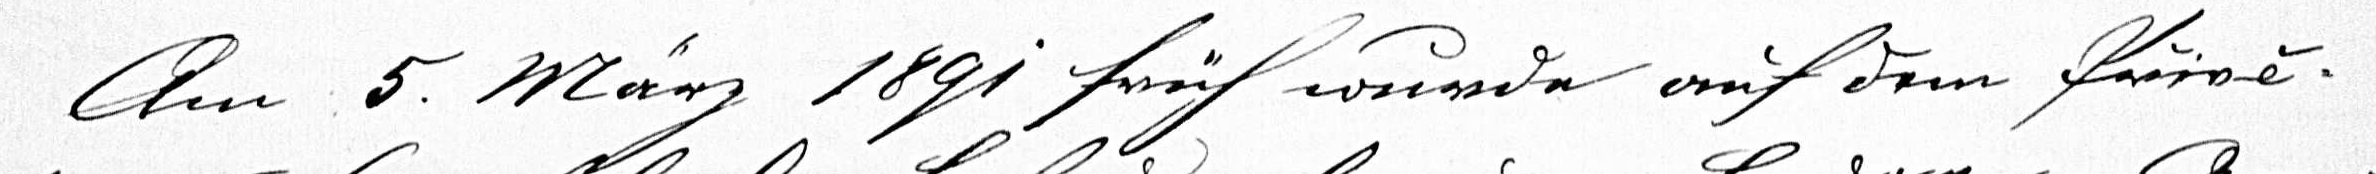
Am 5. März 1891 früh wurde auf dem Přivě¬
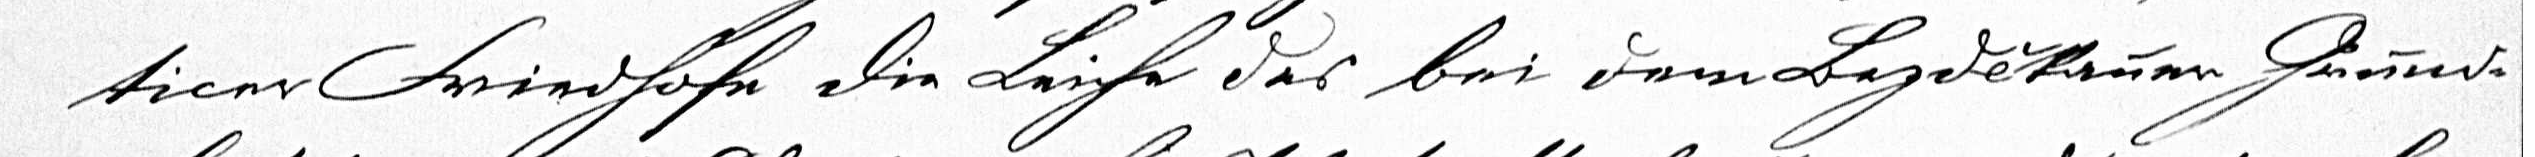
ticer Friedhofe die Leiche des bei dem Bezděkauer Grund¬
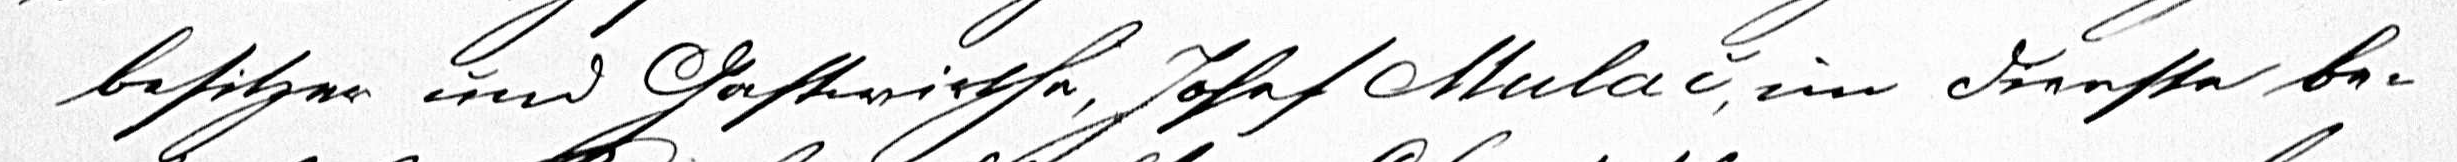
besitzer und Gastwirthe, Josef Mulač, im Dienste be¬
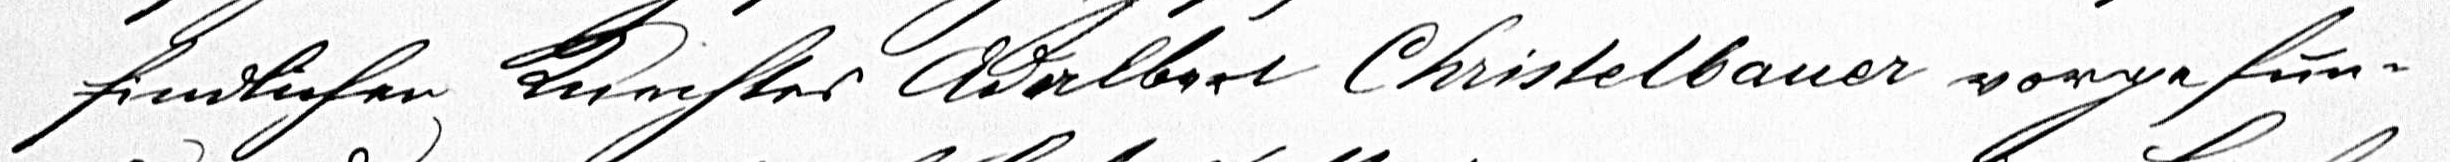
findlichen Knechtes Adalbert Christelbauer vorgefun¬
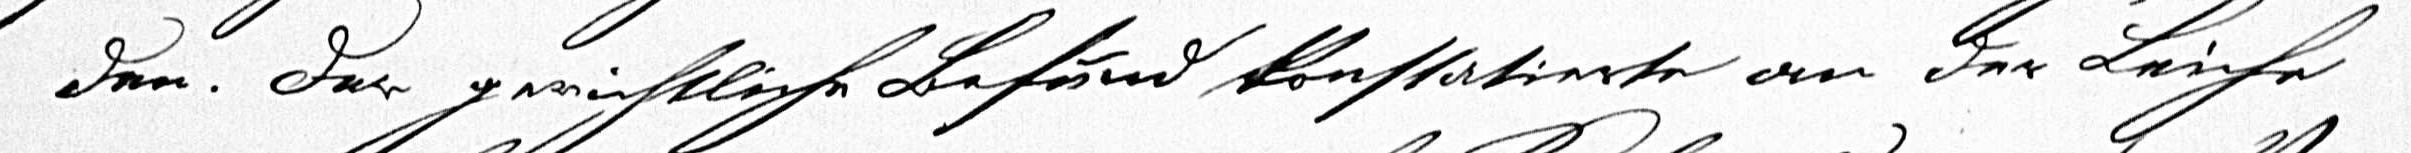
den. Der gerichtliche Befund konstatirte an der Leiche
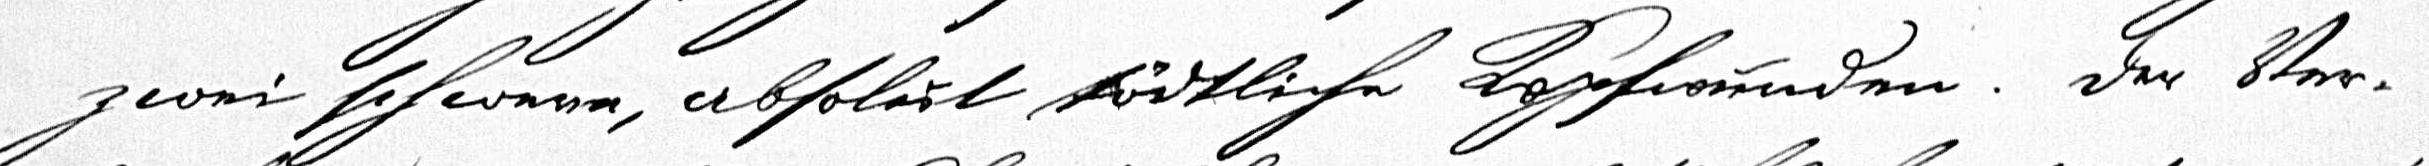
zwei schwere, absolut tödtliche Kopfwunden. Der Ver¬
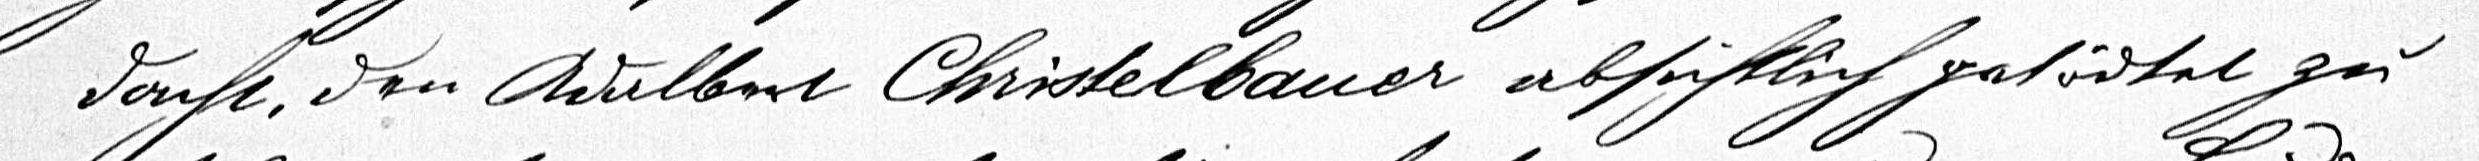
dacht, den Adalbert Christelbauer absichtlich getödtet zu
